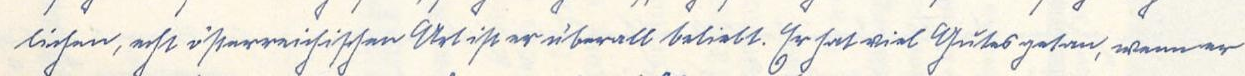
lichen, echt österreichischen Art ist der über allen beliebt. Er hat viel Gutes getan, wenn er
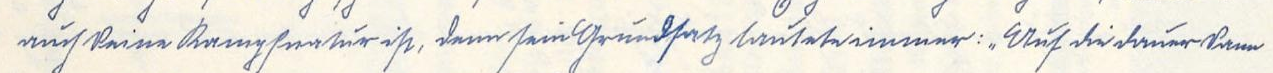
auch keine Kampfnatur ist, denn sein Grundsatz lautete immer: „Auf die Dauer kann
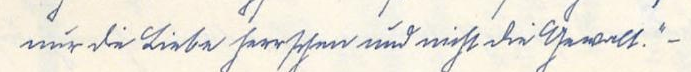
nur die Liebe herrschen und nicht die Gewalt.“-
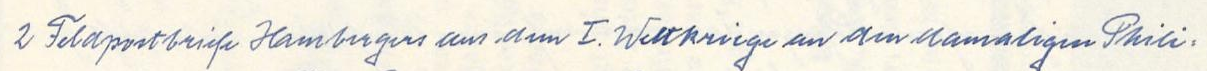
2 Feldpostbriefe Hambergers aus dem I. Weltkrieg an den damaligen Phili-
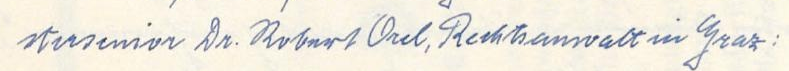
stersenior Dr. Robert Orel, Rechtsanwalt Graz:
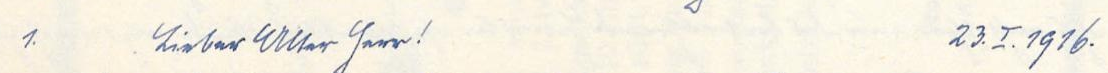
1. Lieber Alter Herr! 23 I. 1926
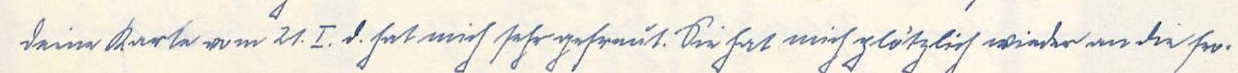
Deine Karte vom 21. I. d. hat mich sehr gefreut. Sie hat mich plötzlich wieder an die fro-
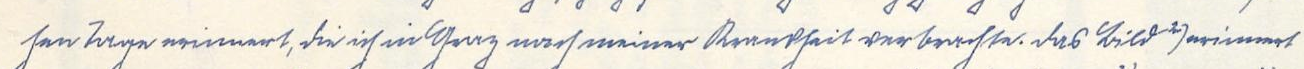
hen Tage erinnert,die ich in Graz nach meiner Krankheit verbrachte. Das Bild 2) erinnert
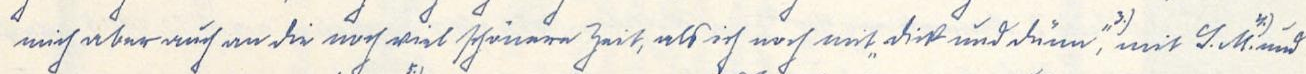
mich aber auch an die noch viel schönere Zeit, als ich noch mit Dick und Dünn, 3) mit S. M. 4) und
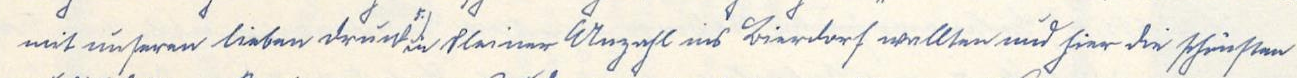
mit unseren lieben Drunk in kleiner Anzahl ins Bierdorf wollten und hier die schönsten
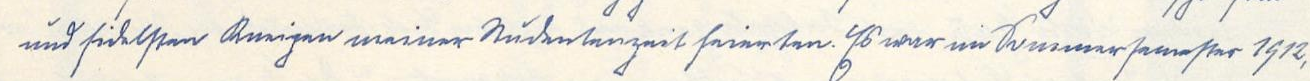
und fidelsten Kneipen meiner Studentenzeit feierten. Es war im Sommersemester 1912,
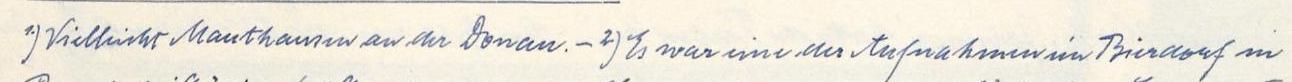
1) vielleicht Mauthausen an der Donau. – 2)Es war eine der Aufnahme in Bierdorf in
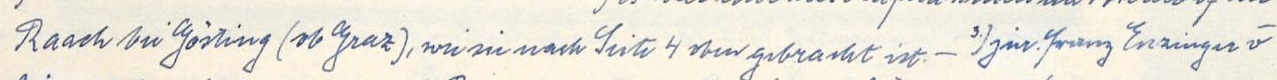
Raach bei Gösling (ob Graz), wie sie nach Seite 4 oben gebracht ist. – 3) iur. Franz Enzinger v/o
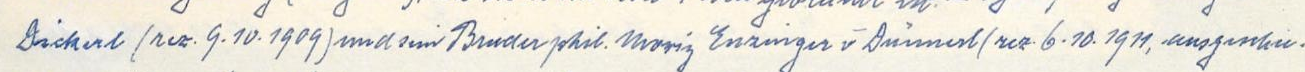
Dickal (rez. 9.10.1909) und ein sein Bruder phil. Moriz Enzinger v/o Dummerl (rez. 6.10. 1911, ausgesch.
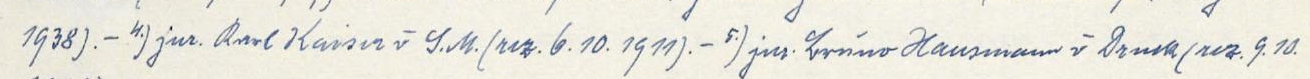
1938). – iur. Karl Kaiser v/o S. M. (rez. 6. 10. 1911).- 5) iur. Bruno Hausmann v/o Druck (rez. 9.10.
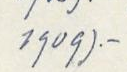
1909).-
